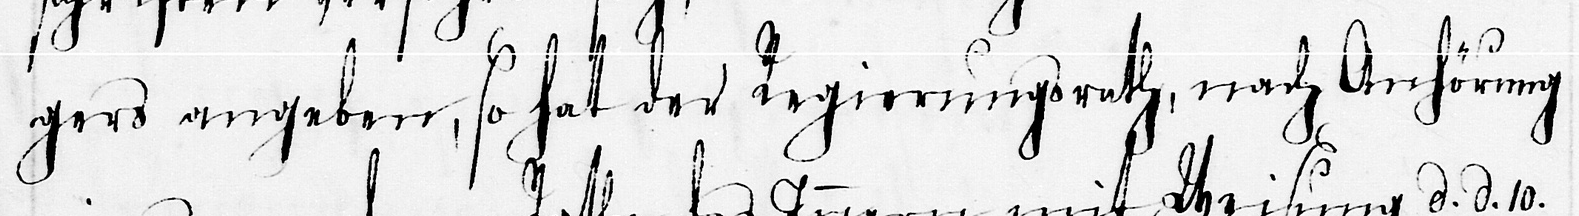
gers angeben, so hat der Regierungsrath, nach Anhörung
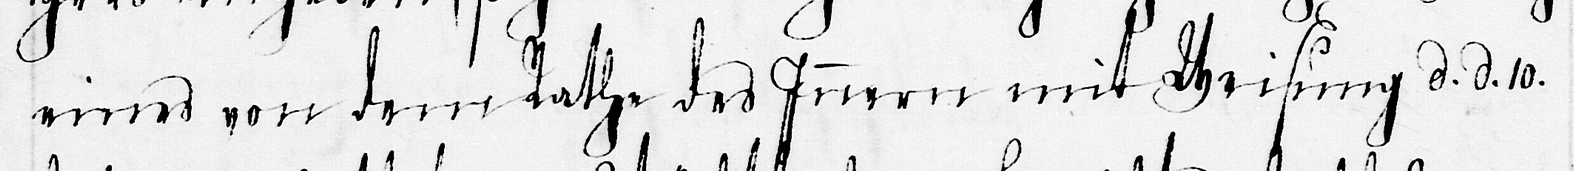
eines von dem Rathe des Innern mit Weisung d. d. 10.
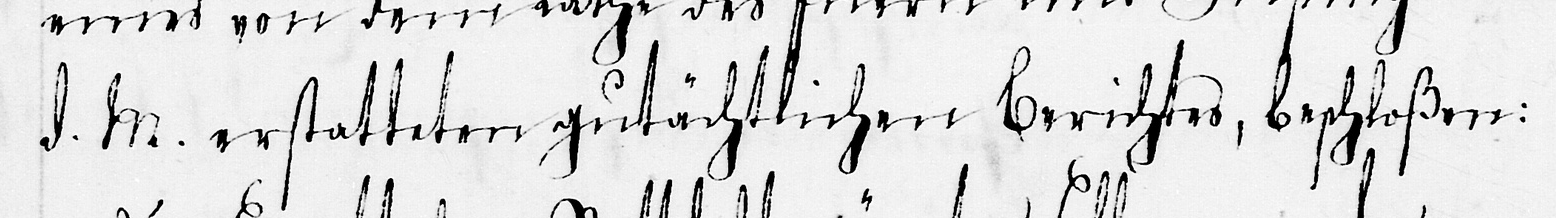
d. M. erstatteten gutächtlichen Berichtes, beschloßen:
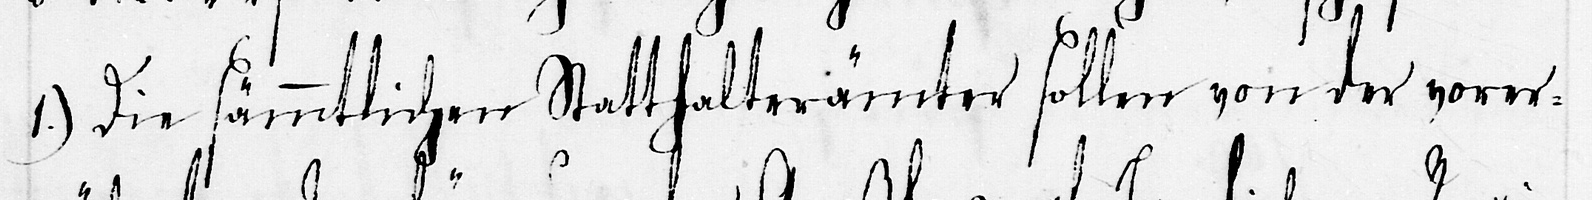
1.) Die sämmtlichen Statthalterämter sollen von der vorer¬
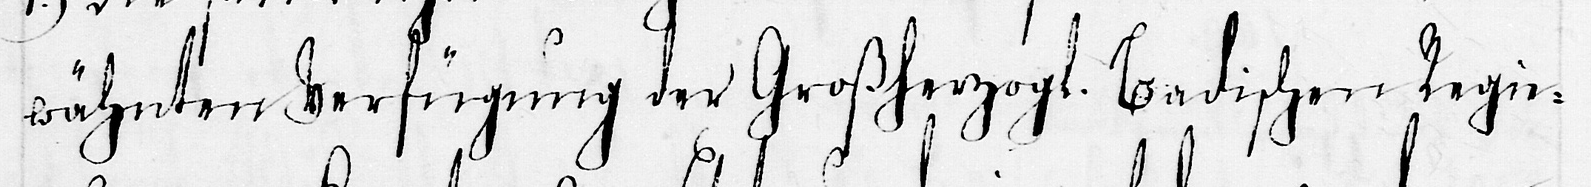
wähnten Verfügung der Großherzogl. Badischen Regie¬
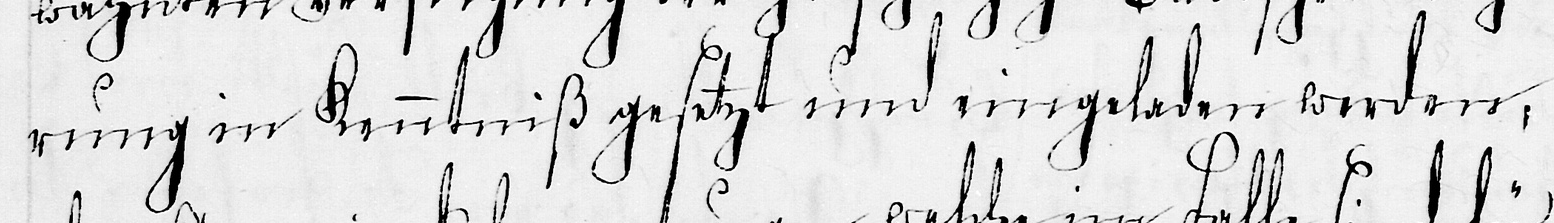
rung in Kenntniß gesetzt und eingeladen werden,
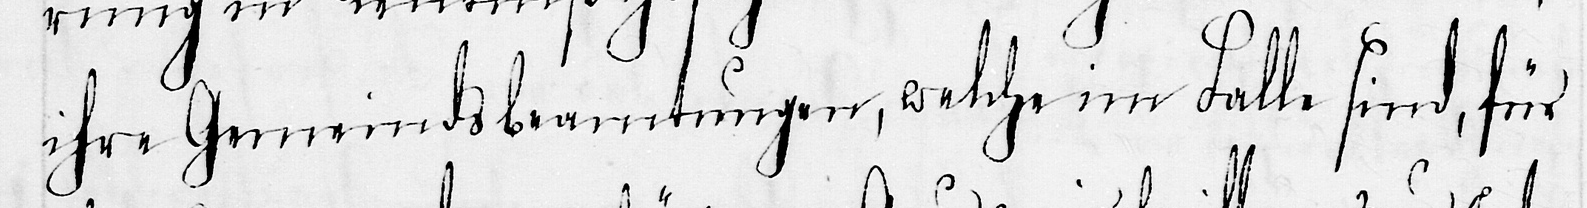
ihre Gemeindsbeamtungen, welche im Falle sind, für
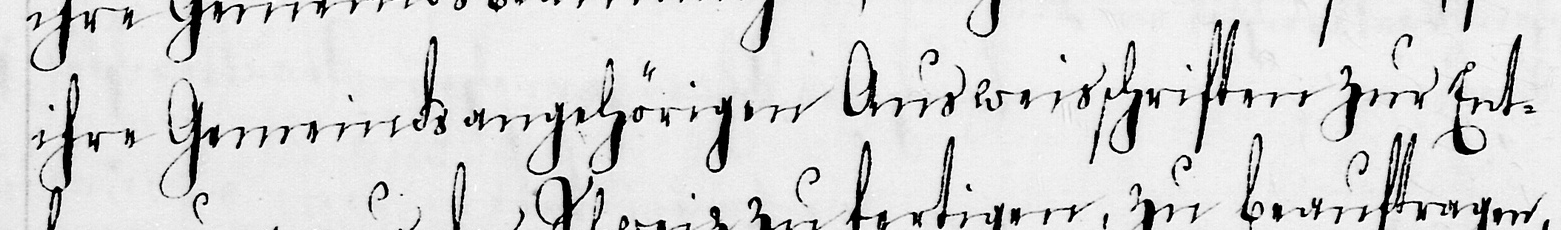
ihre Gemeindsangehörigen Ausweisschriften zur Ent¬
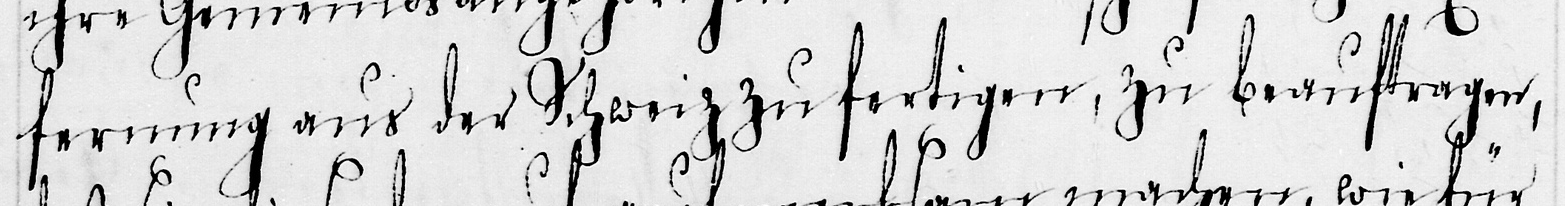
fernung aus der Schweiz zu fertigen, zu beauftragen,
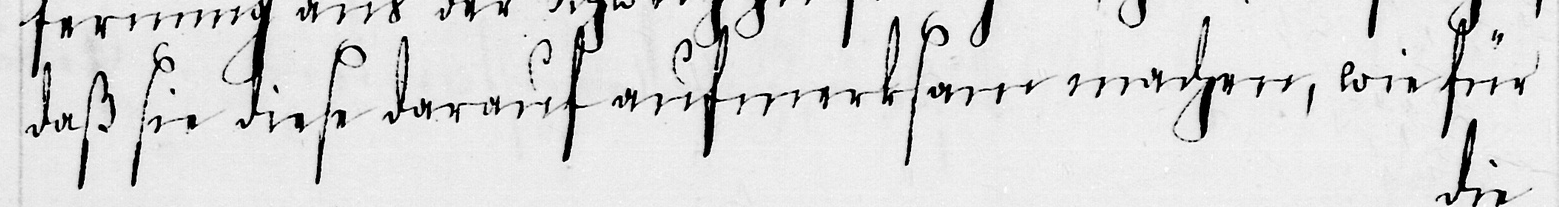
daß sie diese darauf aufmerksam machen, wie für
